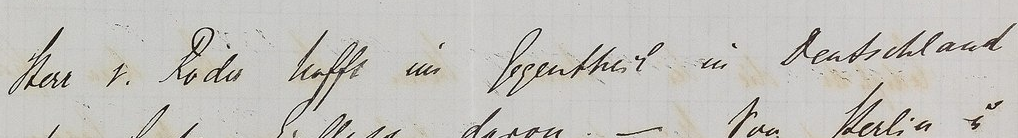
Herr v. Röder hofft im Gegentheil in Deutschland
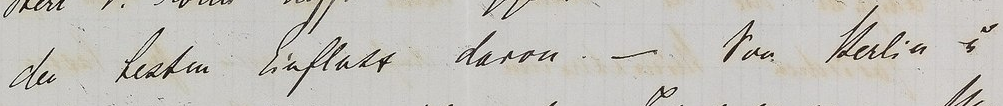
den besten Einfluss davon. – Von Berlin u
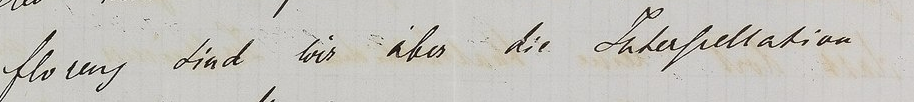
Florenz sind wir über die Interpellation
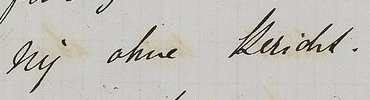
ny ohne Bericht.
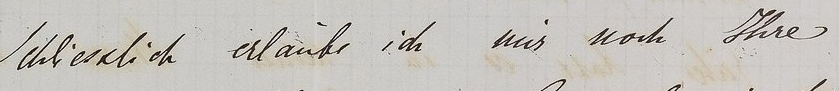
Schliesslich erlaube ich mir noch Ihre
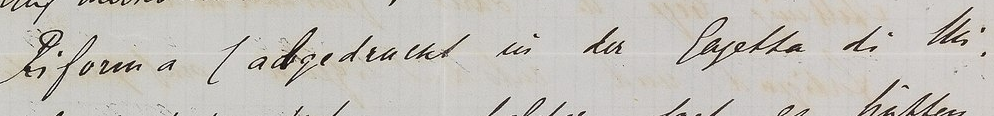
Riforma (abgedruckt in der Gazetta di Mi-
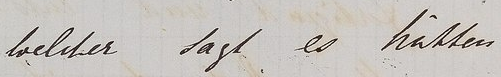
welcher sagt es hätten
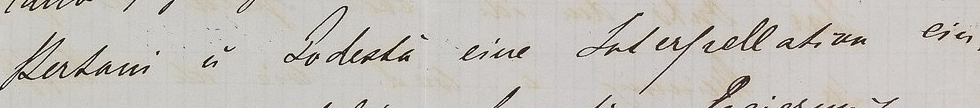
Bertani u Podestà eine Interpellation ein-
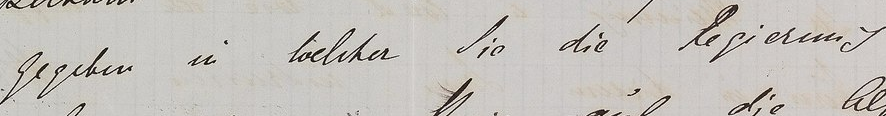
gegeben in welcher sie die Regierung
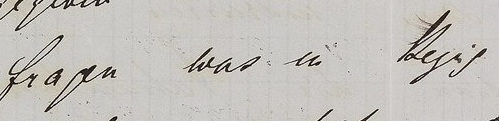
fragen was in Bezug
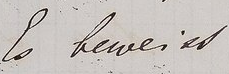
die Alpen -
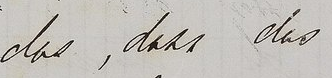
das, dass das
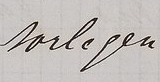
Vertrag nicht
